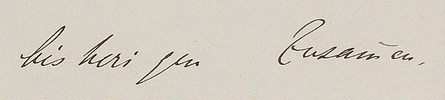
bisherigen Zusammen-
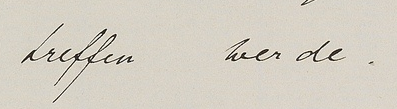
treffen werde.
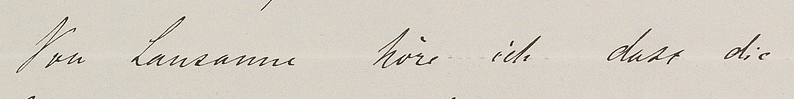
Von Lausanne höre ich dass die
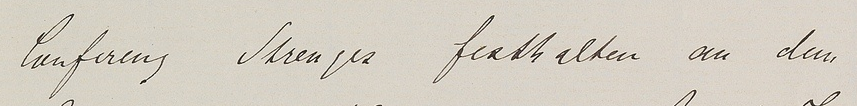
Conferenz strenges Festhalten an dem
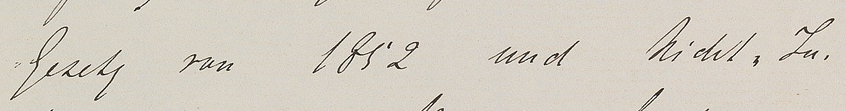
Gesetz von 1852 und Nicht-In-
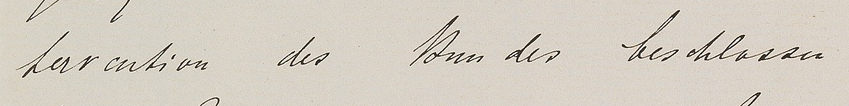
teraction des Bundes beschlossen
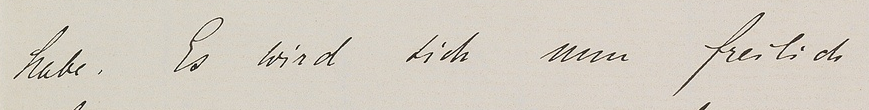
habe. Es wird sich nun freilich
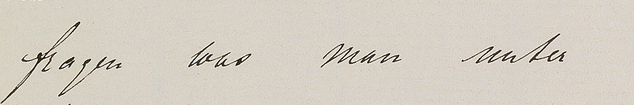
fragen was man unter
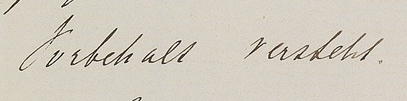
Vorbehalt versteht.
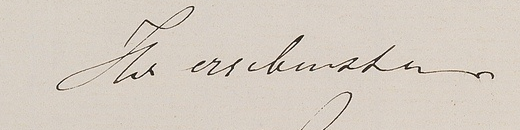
Ihr ergebenster
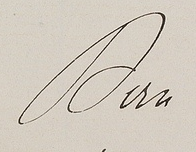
Bern
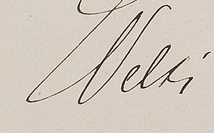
1869.
